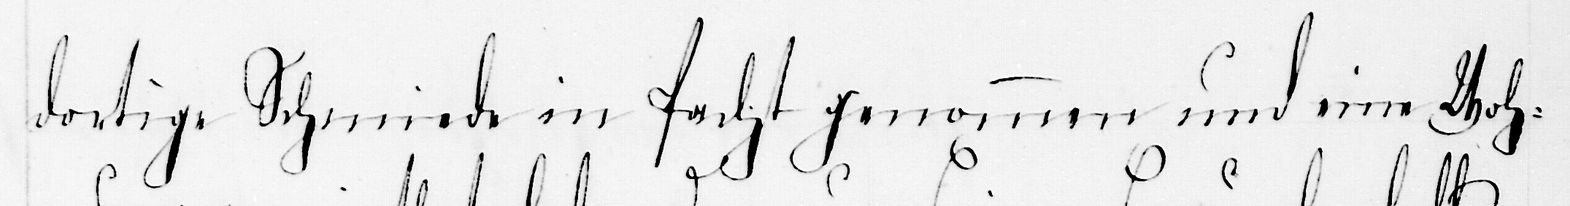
dortige Schmiede in Pacht genommen und eine Woh¬
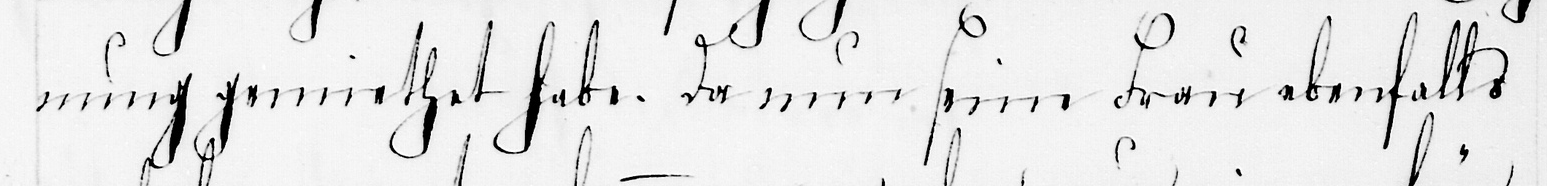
nung gemiethet habe. Da nun seine Frau ebenfalls
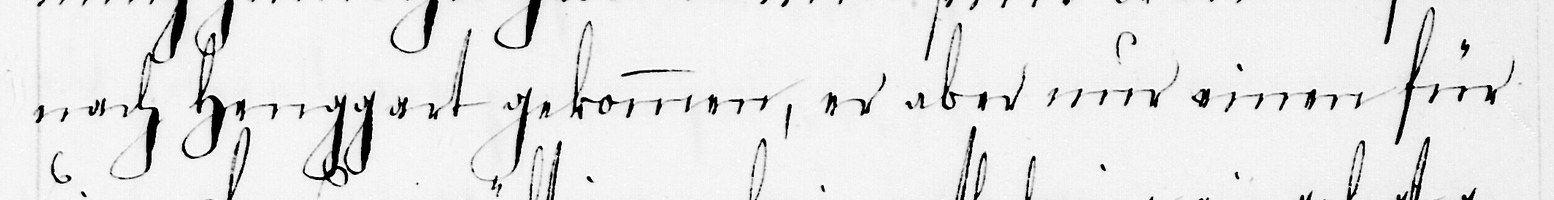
nach Henggart gekommen, er aber nur einen für
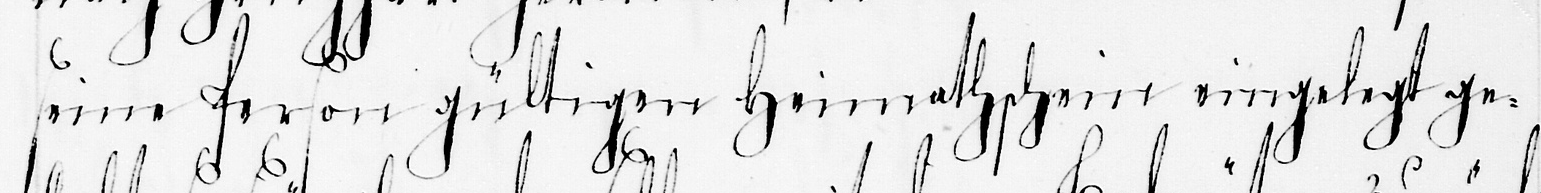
seine Person gültigen Heimathschein eingelegt ge¬
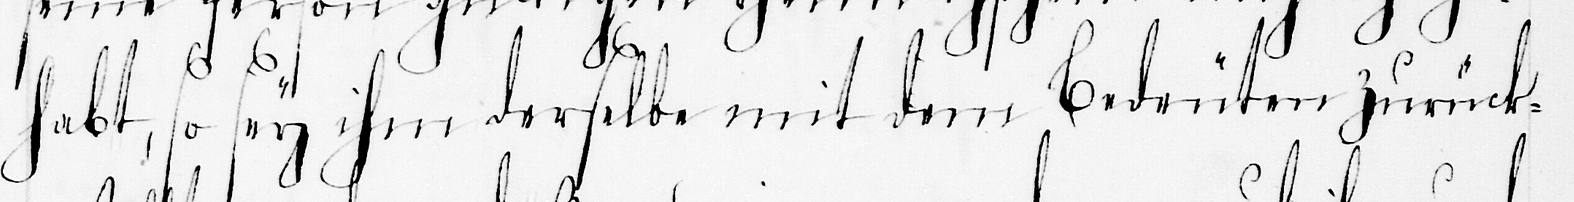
habt, so sey ihm derselbe mit dem Bedeuten zurück¬
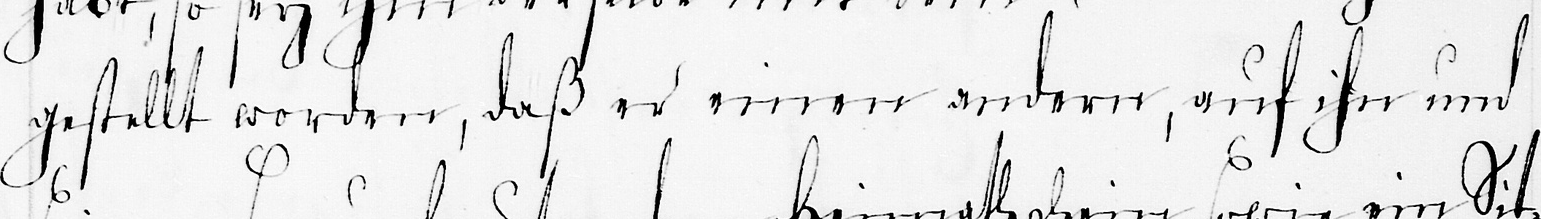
gestellt worden, daß er einen andern, auf ihn und
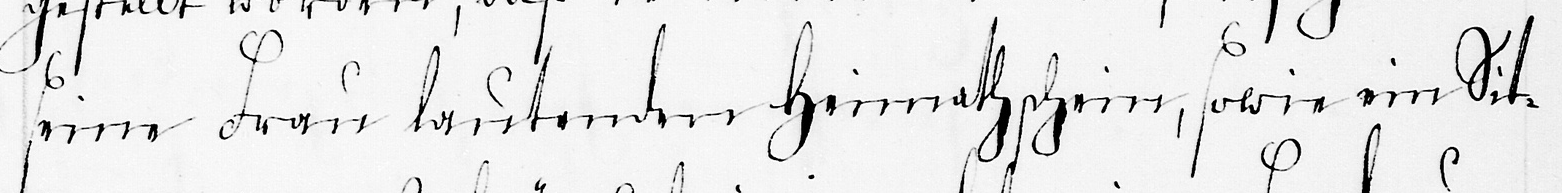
seine Frau lautenden Heimathschein, sowie ein Sit¬
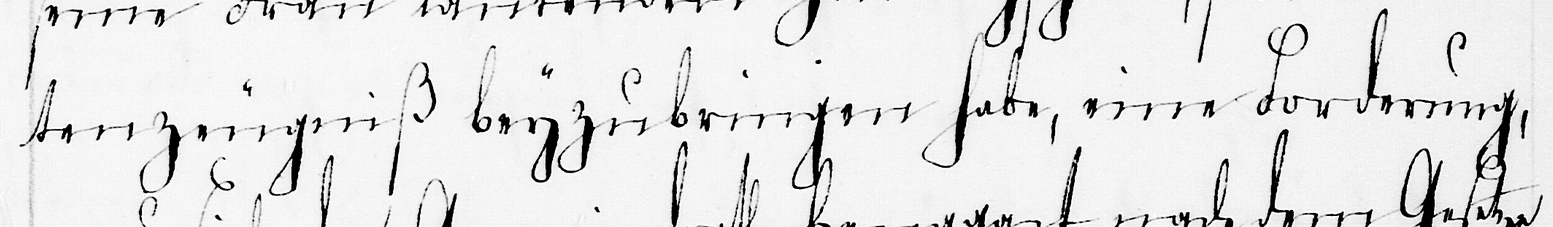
tenzeugniß beyzubringen habe, eine Forderung,
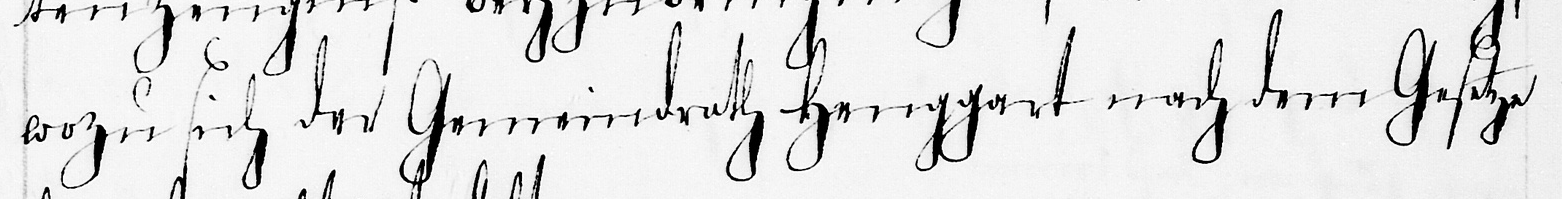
wozu sich der Gemeindrath Henggart nach dem Gesetze
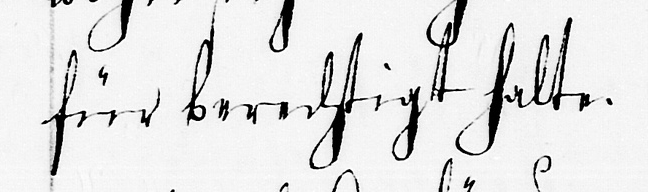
für berechtigt halte.
